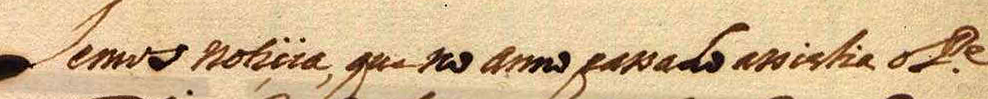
Temos noticia, que no anno passado assistia o P.e
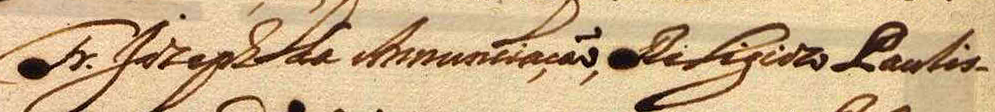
Fr. Jozeph da Annunciaçaõ, Religiozo Paulis
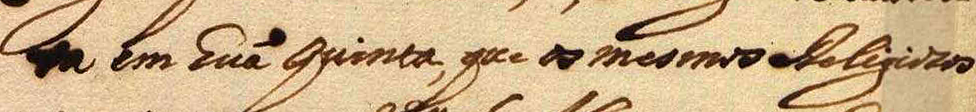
ta em huā quinta, que os mesmos Religiozos
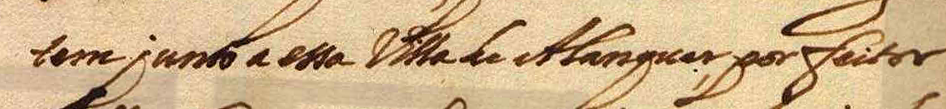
tem junto a essa Villa de Alanquer, por feitor
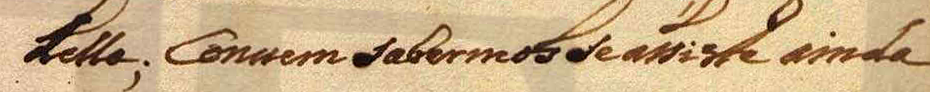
della, Conuem sabermos se assiste ainda
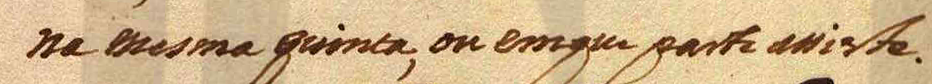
na mesma quinta, ou em que parte assiste.
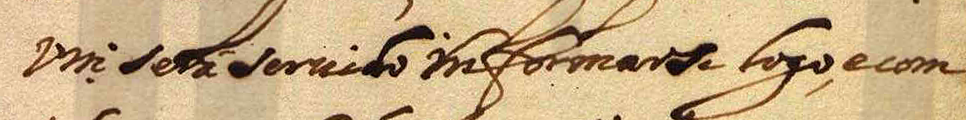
vm sera seruido informarse logo, e com
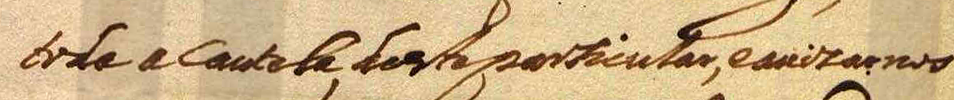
toda a Cautela deste particular, e auizarnos
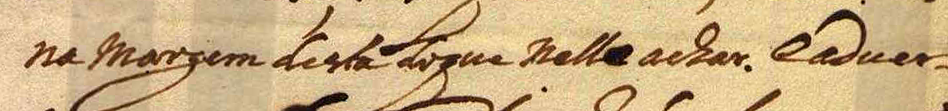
na margem desta do que nelle achar. E aduer
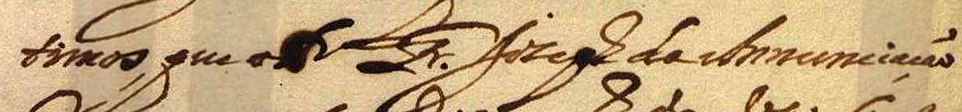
timos, que o R Fr. Jozeph da Annunciaçaõ
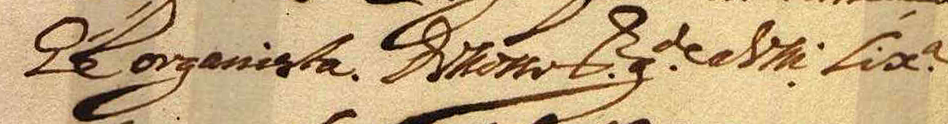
hé organista. Ds nosso s.r g.de a V M lix.a
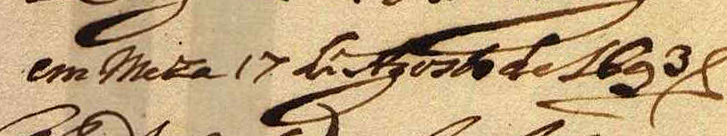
em meza 17 de Agosto de 1693
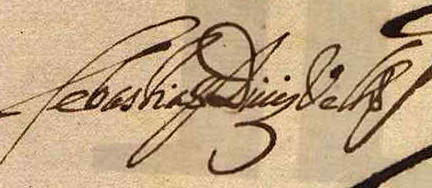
Sebastiaõ Diniz Velho
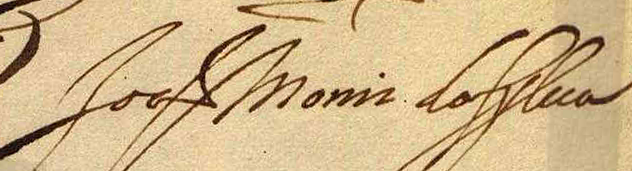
Joaõ Moniz da Sylua
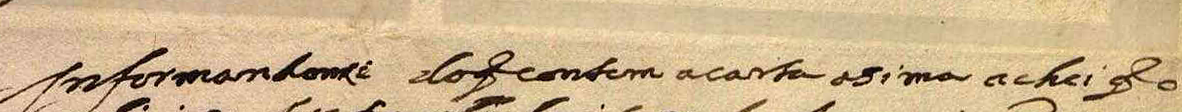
Jnformandome do q̄ contem a carta asima achei q̄ o
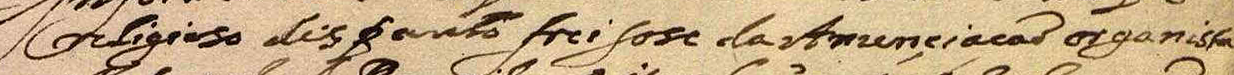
religioso de s paulo frei Jose da Anunciaçaõ organista
